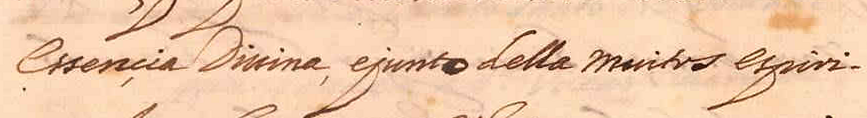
essencia Divina, e junto della muitos espiri
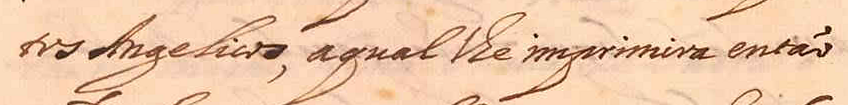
tos Angelicos, a qual lhe imprimira entaõ
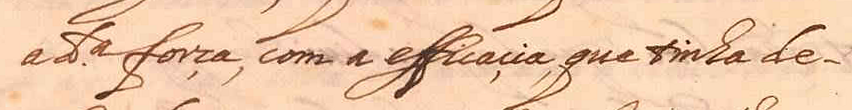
a d̄.a força, com a efficacia, que tinha de
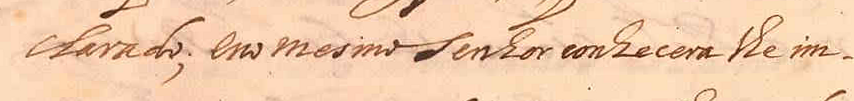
clarado, e no mesmo senhor conhecera lhe im
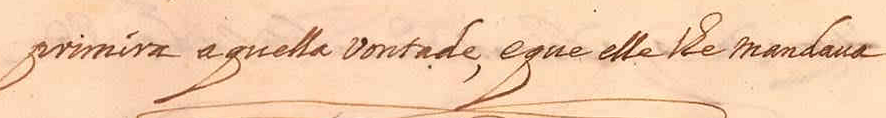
primira aquella vontade, e que elle lhe mandaua
